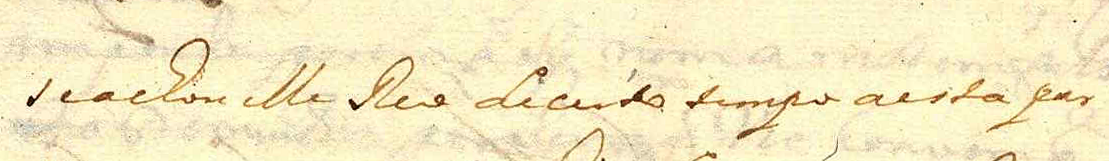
se achou elle Reo de certo tempo a esta par
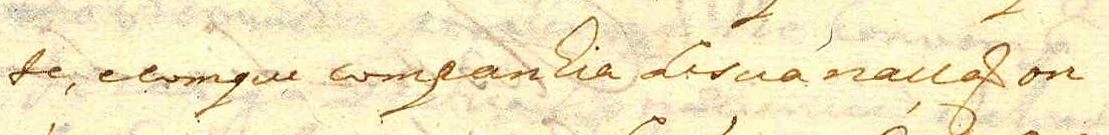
te, e com que companhia de sua nacçaõ on
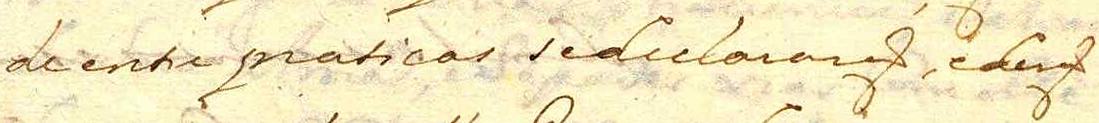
de entre praticas se declararaõ, e deraõ
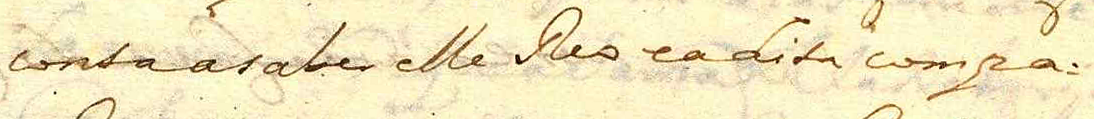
conta a saber elle Reo e a dita compa
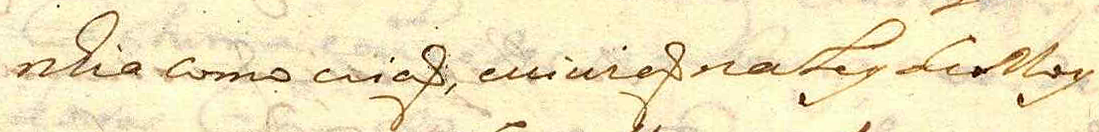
nhia como criaõ, e uiuiaõ na Ley de Moy
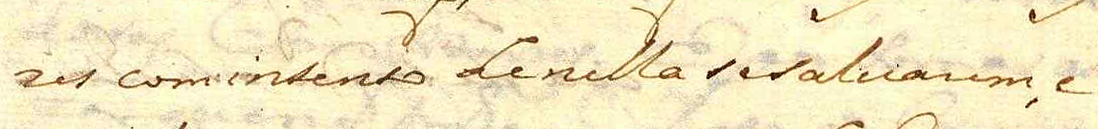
zes com o intento de nella se saluarem, e
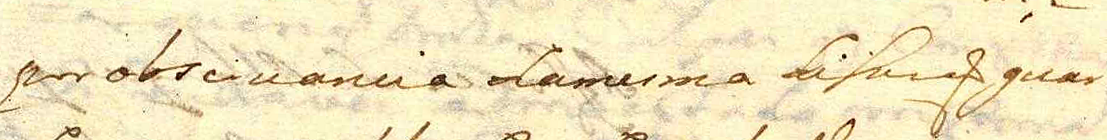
por obseruancia da mesma disseraõ guar
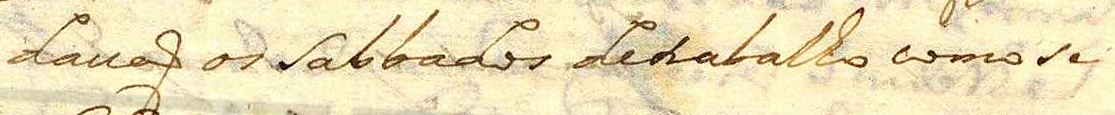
dauaõ os sabbados de trabalho como se
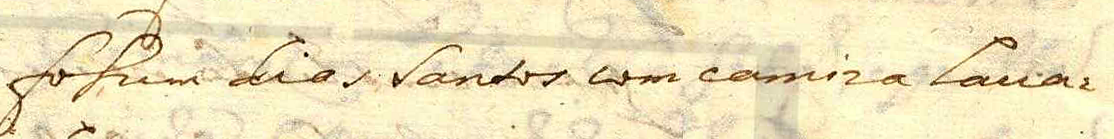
fossem dias santos com camiza laua
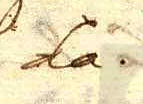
da.
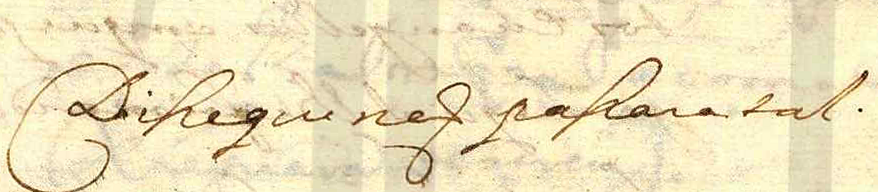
Disse que naõ passara tal.
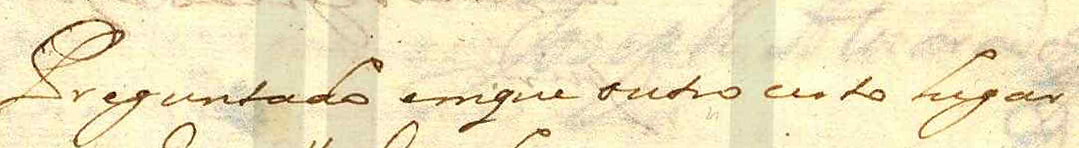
Preguntado em que outro certo lugar
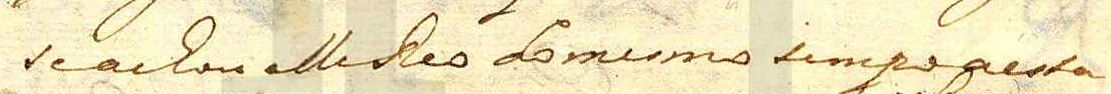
se achou elle Reo do mesmo tempo a esta
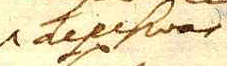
de pessoas
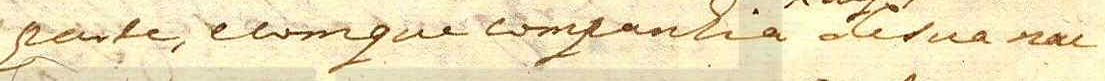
parte, e com que companhia de sua nac
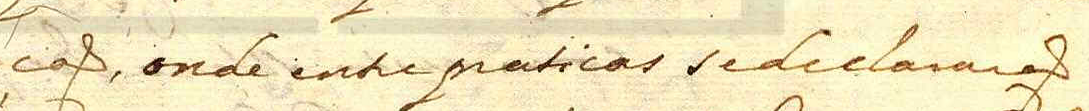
çaõ, onde entre praticas se declararaõ
